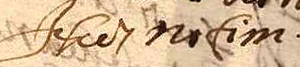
Jesus no fim.
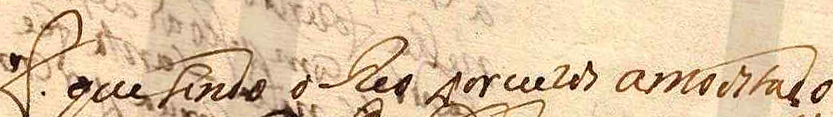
P. que sendo o Reo por uezes amoestado
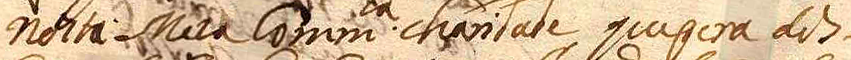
nesta Meza Com m.ta charidade, que pera des
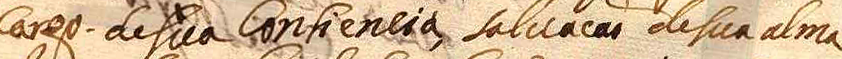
cargo. de sua Consiencia, saluacaõ de sua alma
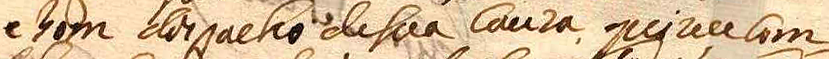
e bom despacho de sua cauza, quizeçe com
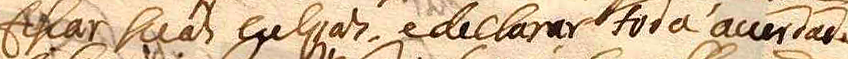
fessar suas culpas. e declarar toda a uerdade
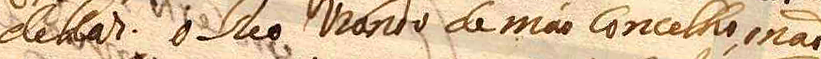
dellas. o Reo Vzando de máo Concelho, o não
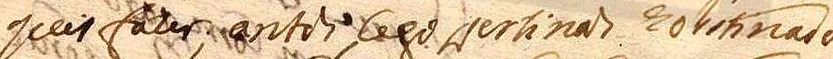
quis fazer; antes cego pertinas E obstinado
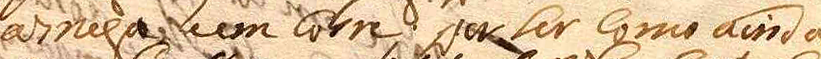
as nega, e emcobre; por ser como ainda
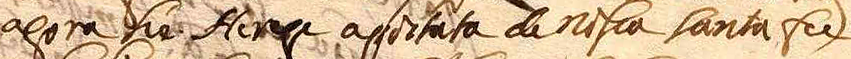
agora hé Herege apostata de nossa santa fee
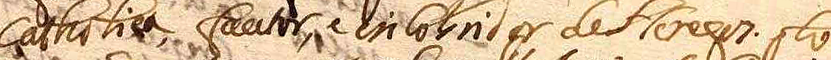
Catholica, fautor, e encobridor de Hereges. plo
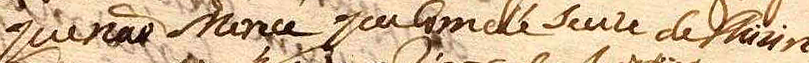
que não Mereçe que com elle se uze de Miziri
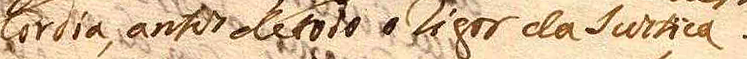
cordia, antes de todo o Rigor da Justiça.
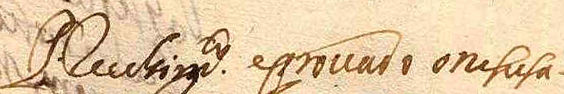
P. Recebim.to e prouado o nessesa
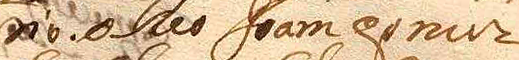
rio. o Reo Joam gomez
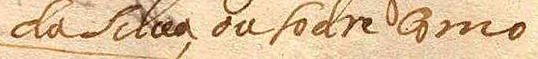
da Silua, ou sodre como
